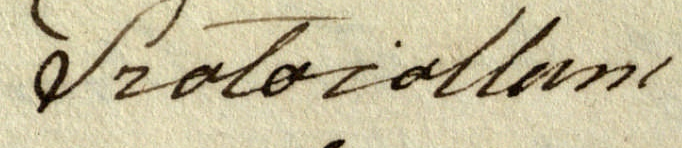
Protocollum
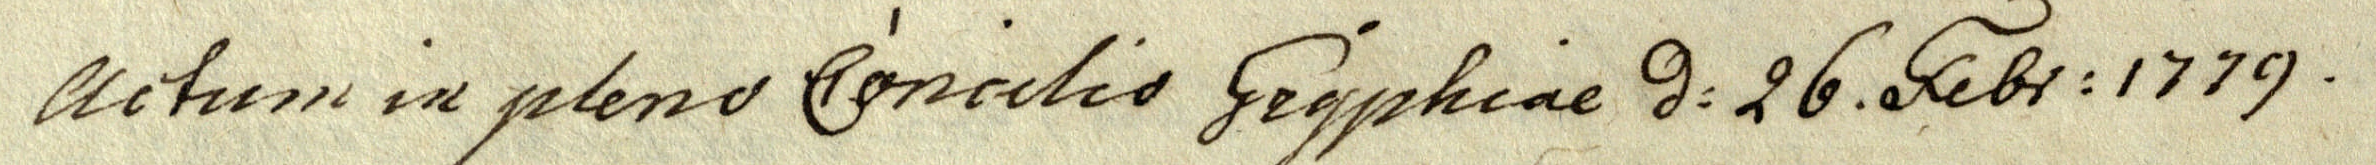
Actum in pleno Concilio Grÿphiae d. 26. Febr. 1779.
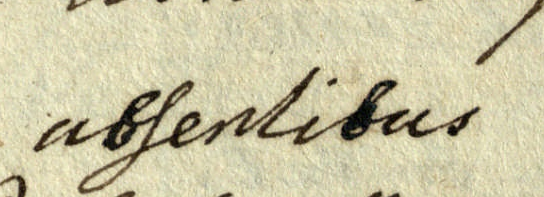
absentibus
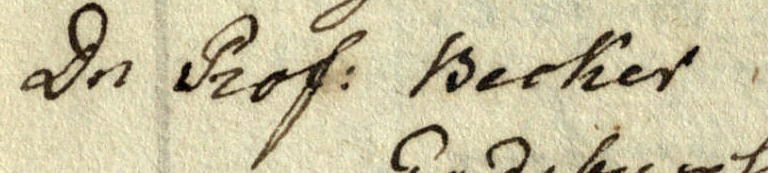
Dn Prof. Becker
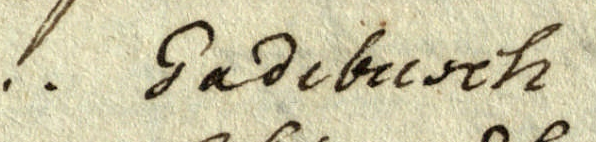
Gadebusch
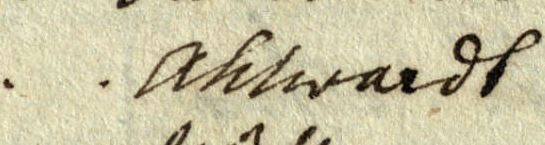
Ahlwardt
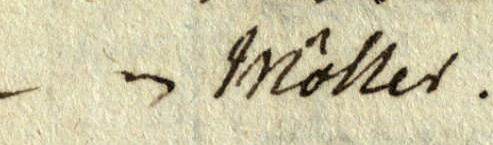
Möller.
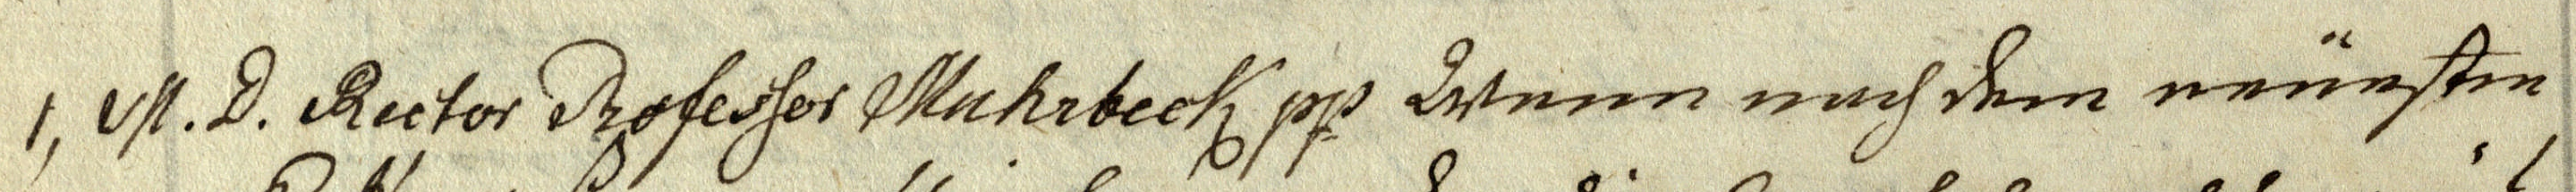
1, M. D. Rector Professor Muhrbeck pp. Wenn nach dem neuesten
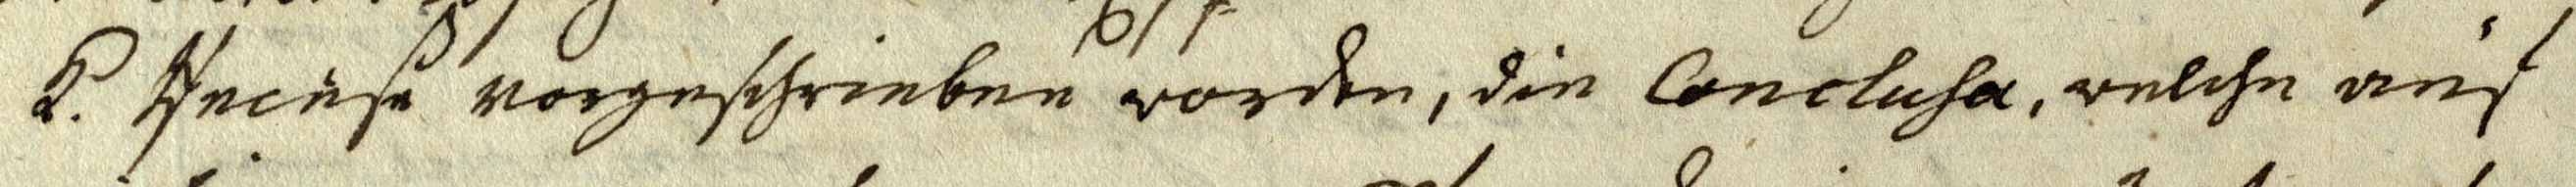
K. Receße vorgeschrieben worden, die Conclusa, welche auf
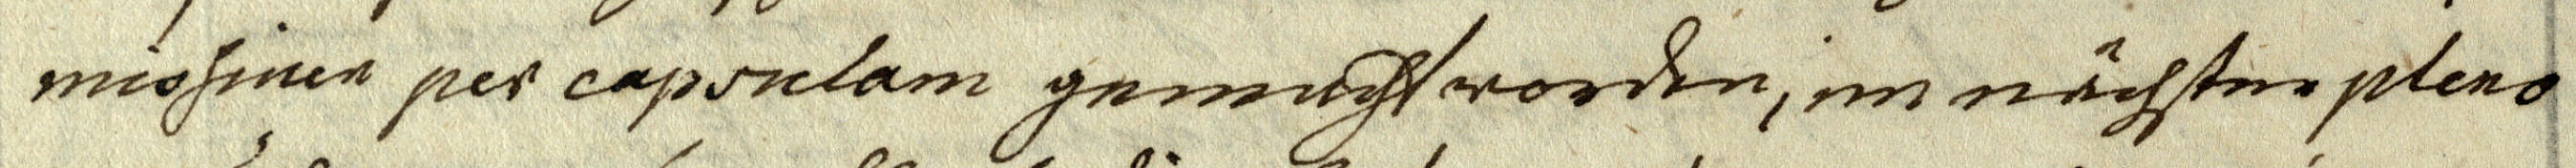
missima per capsulam gemacht worden, im nächsten pleno
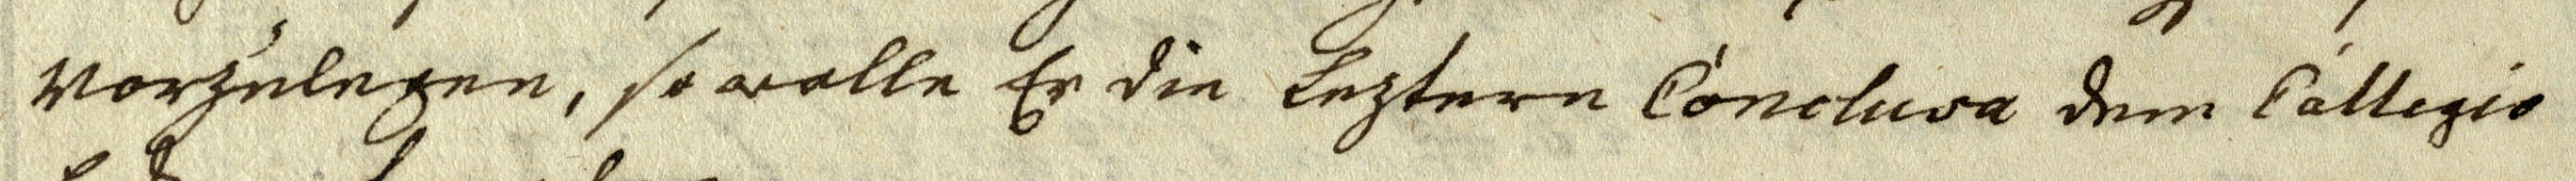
vorzulegen, so wolle Er die leztern Conclusa dem Collegio
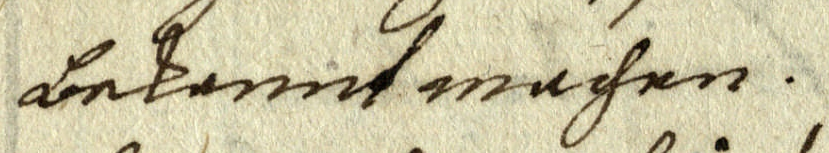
bekannt machen.
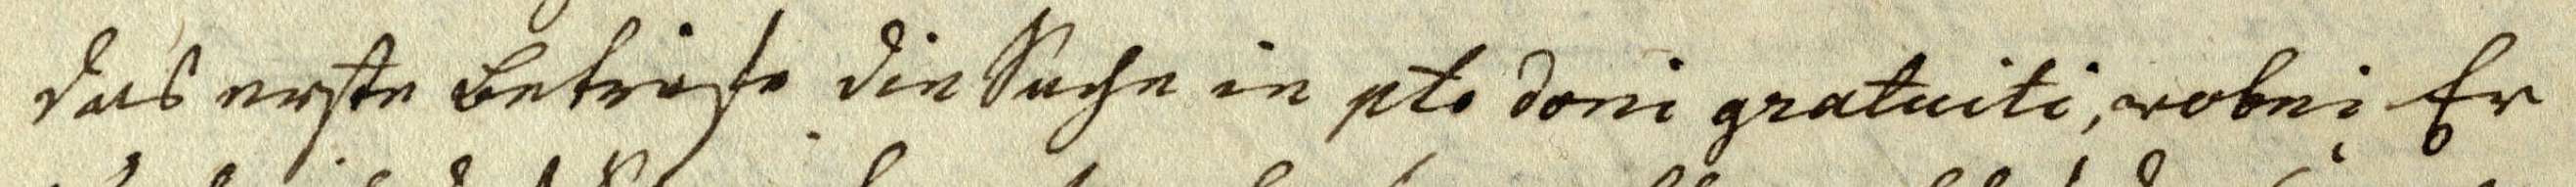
Das erste beträfe die Sachen in pto doni gratuiti, wobei Er
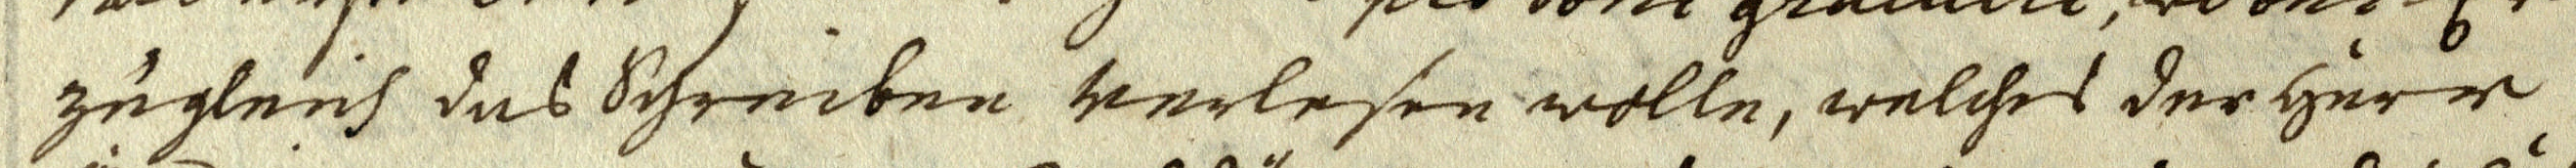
zugleich das Schreiben verlesen wolle, welches der Herr
